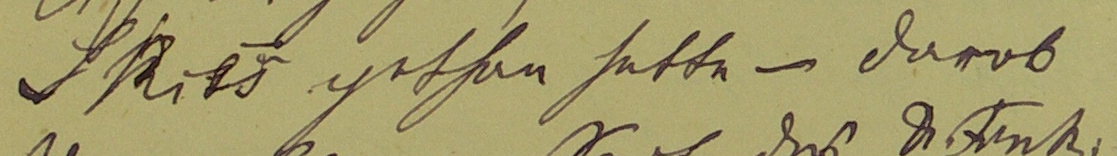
Skiso gethan hatte, - Darob
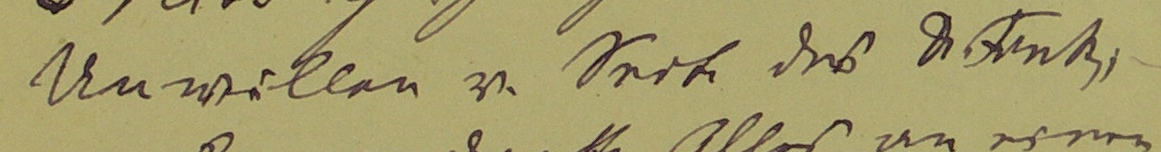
Unwillen v. Seite des Dr. Fink,
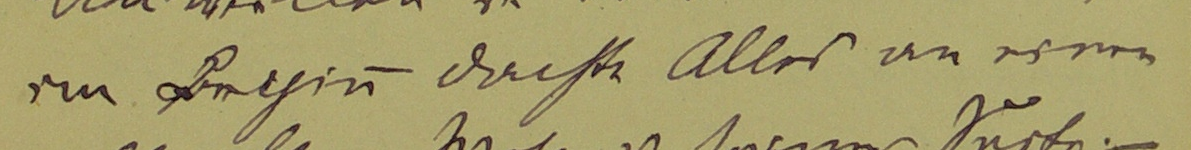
von Begin dachte Alles an einen
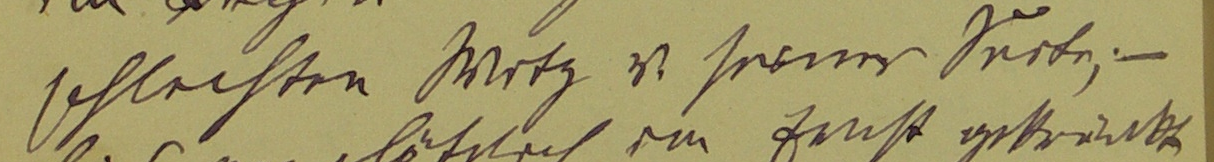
schlechten Witz von seiner Seite; -
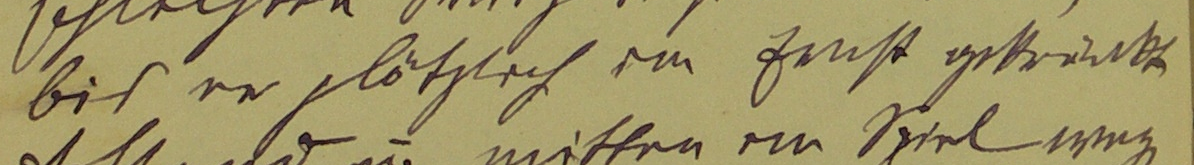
bis er plötzlich
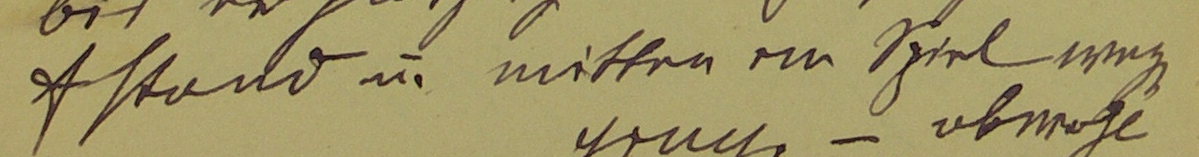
Astand u. mitten im Spiel weg¬
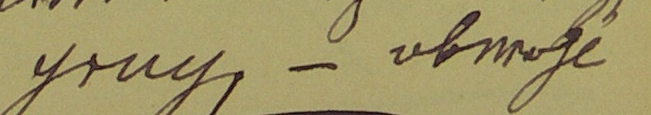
ging, - obwohl
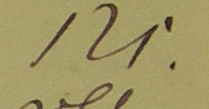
121
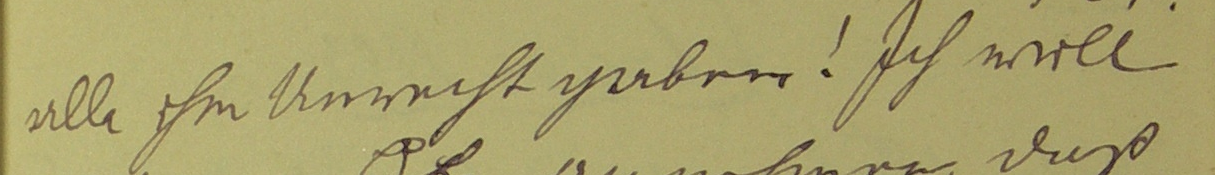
alle ihm Unrecht gaben!- Ich will
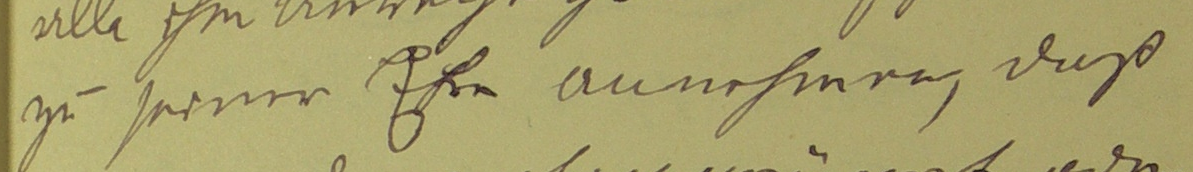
zu seiner Ehre annehmen, daß
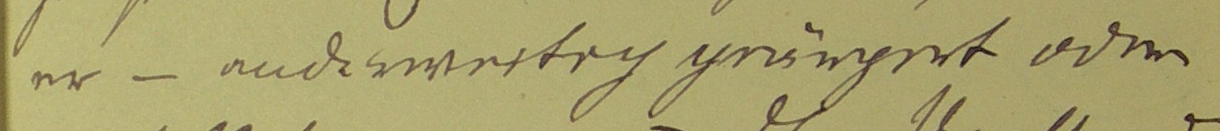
er - anderweitig geärgert
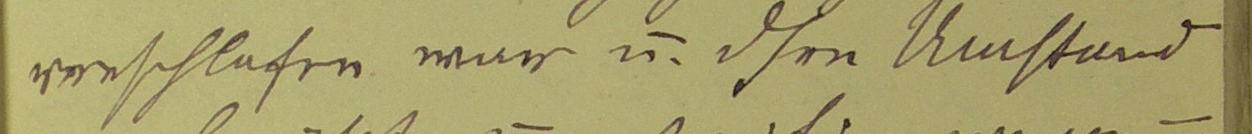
oder verschlafen war u. dsen Umstand
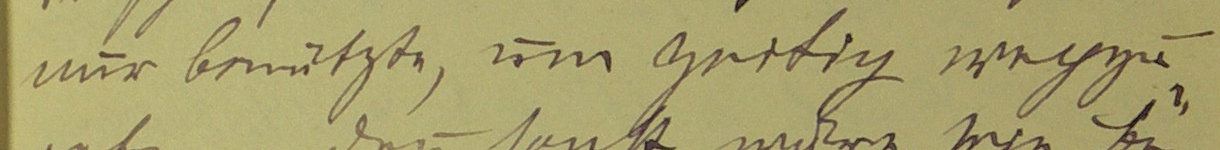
nur benützte, um zeitig wegzu¬
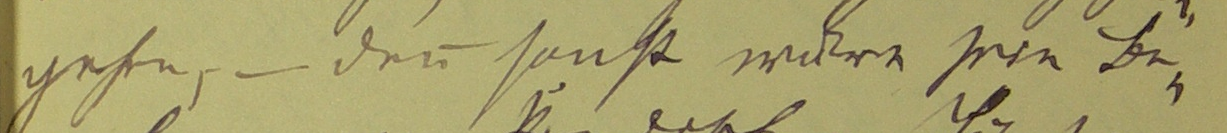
gehen, - denn sonst wäre sein Be¬
